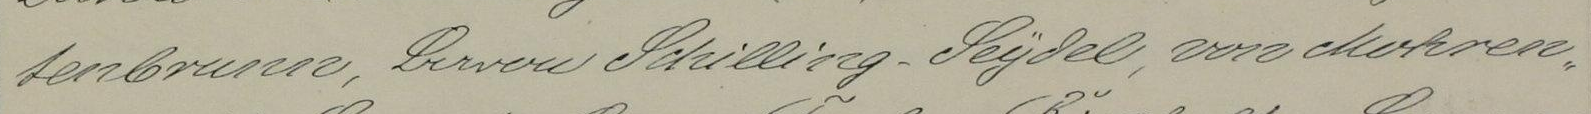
tenbrunn, Baron Schilling-Seydel, von Mohren-
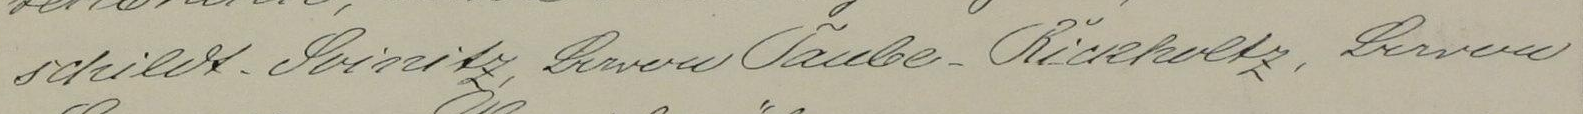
schildt-Soinitz, Baron Taube-Rickholtz, Baron
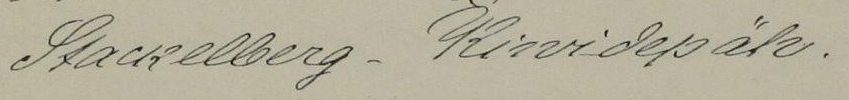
Stackelberg-Kiwidepaeh.
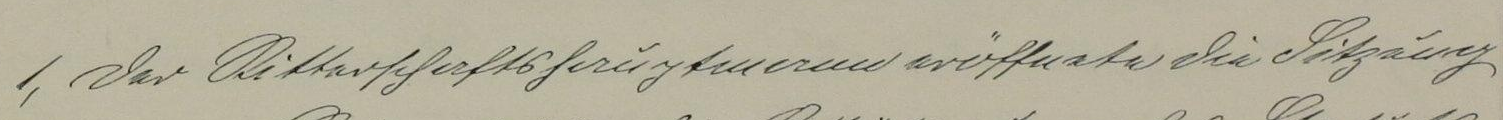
1. Der Ritterschaftshauptmann eröffnete die Sitzung
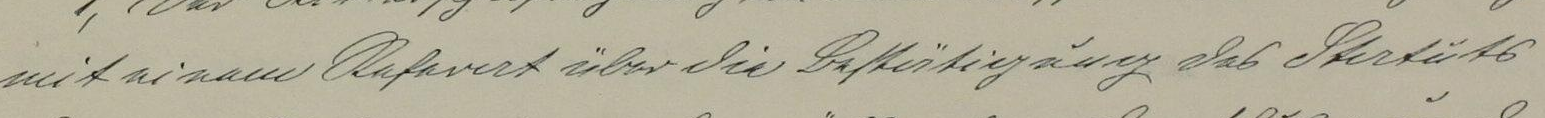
mit einem Referat über die Bestätigung des Statuts
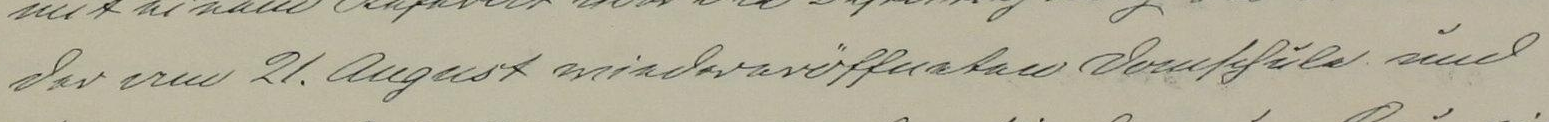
der am 21. August wiedereröffneten Domschule und
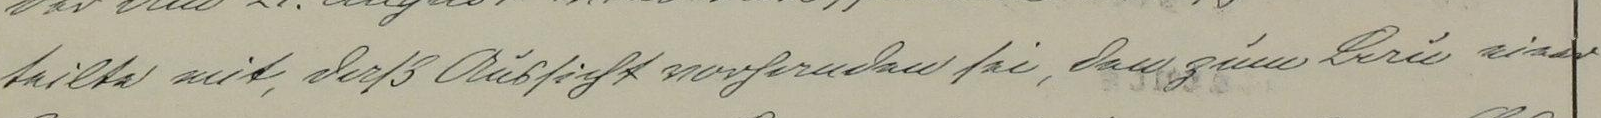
teilte mit, daß Aussicht vorhanden sei, den zum Bau einer
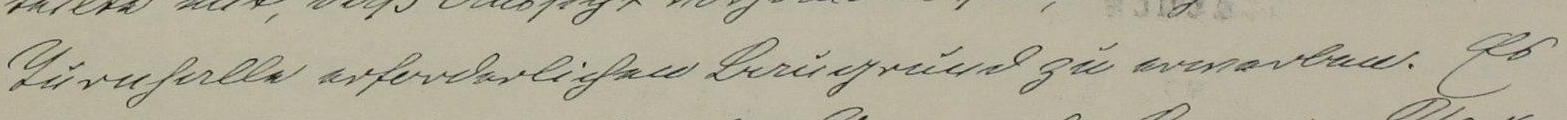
Turnhalle erforderlichen Baugrund zu erwerben. Es
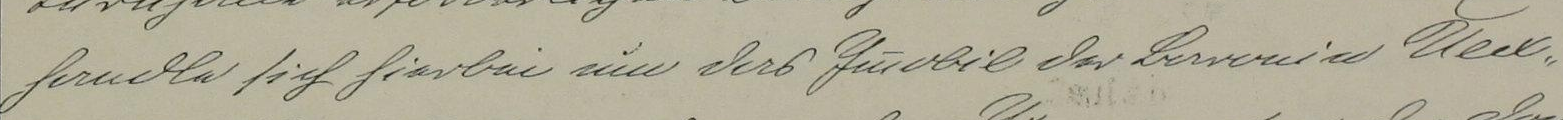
handle sich hierbei um das Immobil der Baronin Uex-
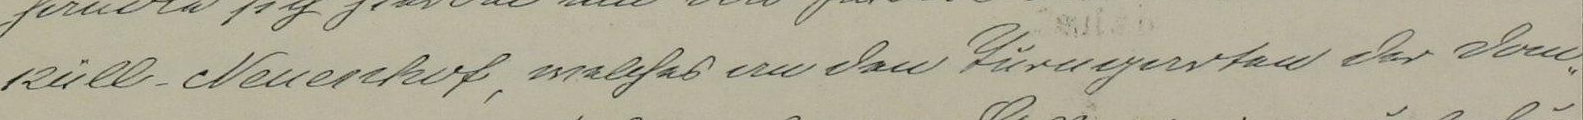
küll-Neuenhof, welches an den Turngarten der Dom-
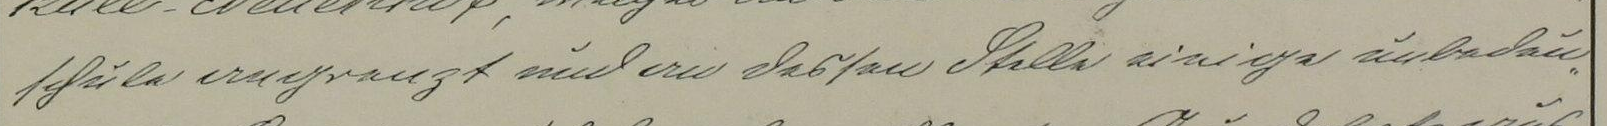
schule angrenzt und an dessen Stelle einige unbedeu-
